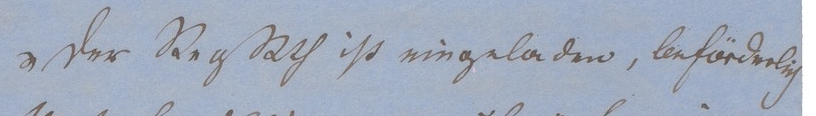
«Der RegRth ist eingeladen, beförderlich
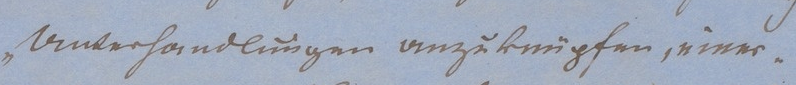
Unterhandlungen anzuknüpfen, einer-
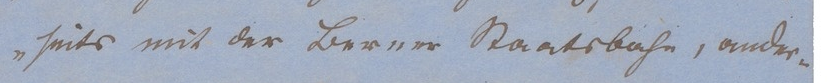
seits mit der Berner Staatsbahn, ander-
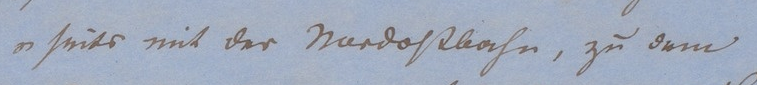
seits mit der Nordostbahn, zu dem
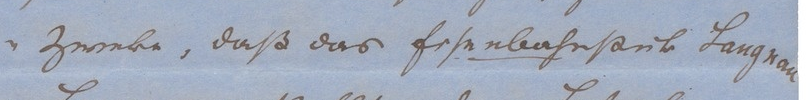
Zweke, daß das Eisenbahnstük Langnau
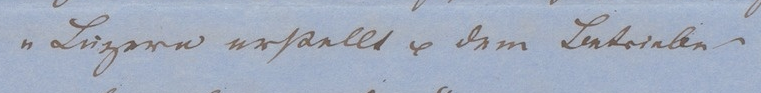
Luzern erstellt & dem Betriebe
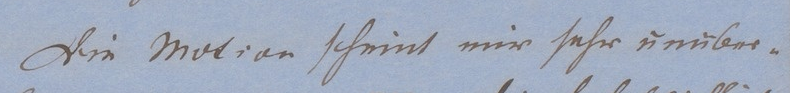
Die Motion scheint mir sehr unüber-
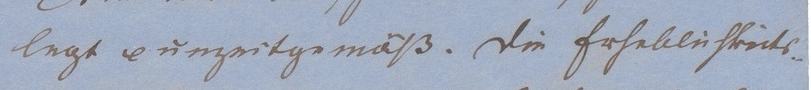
legt &; unzeitgemäß. Die Erheblichkeits-
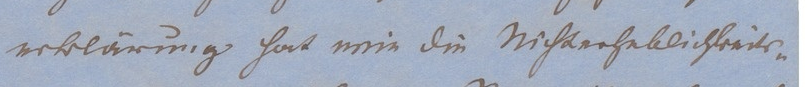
erklärung hat wie die Nichterheblichkeits-
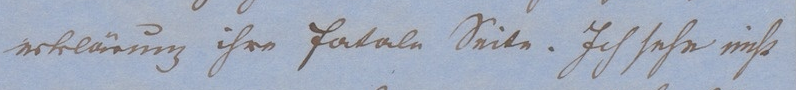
erklärung ihre fatale Seite. Ich sehe nicht
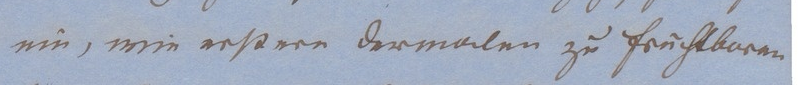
ein, wie erstere dermalen zu fruchtbaren
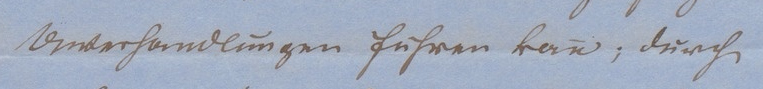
Unterhandlungen führen kann; durch
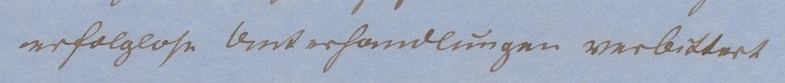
erfolglose Unterhandlungen verbittert
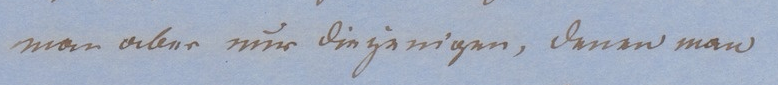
man aber nur diejenigen, denen man
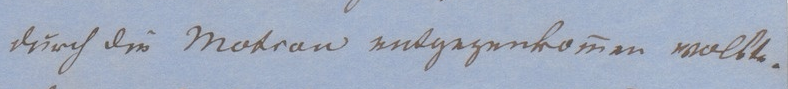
durch die Motion entgegenkommen wollte.
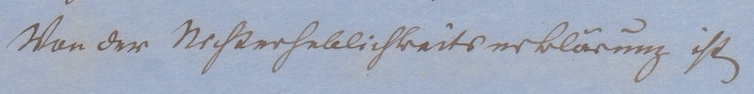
Von der Nichterheblichkeitserklärung ist
